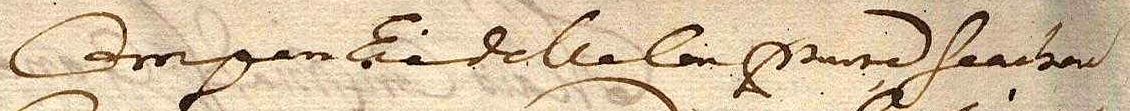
Companhia della Confitente, se achou
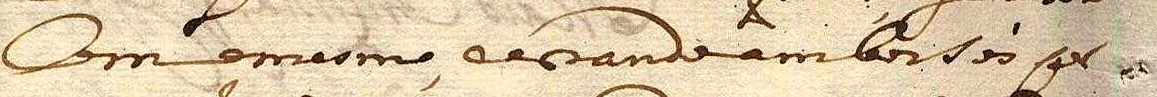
Com o mesmo, e estando ambos sós por
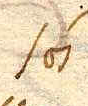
sós
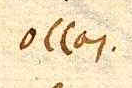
occas.
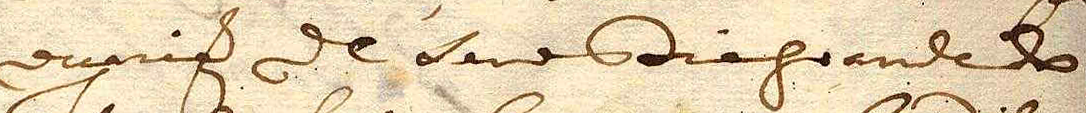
occaziaõ de ser o dia grande do
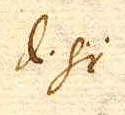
d. gr
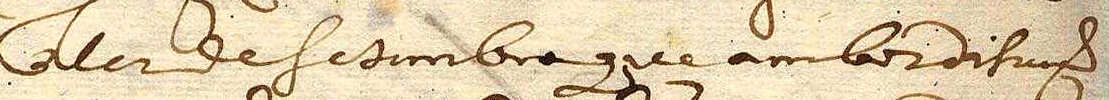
Mez de setembro que ambos diseraõ
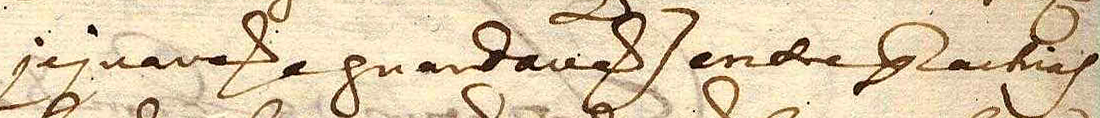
jejuavaõ e guardavaõ entre practicas
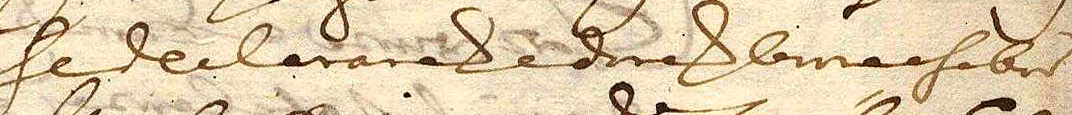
se declararaõ e deraõ conta a saber
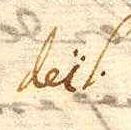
decl.
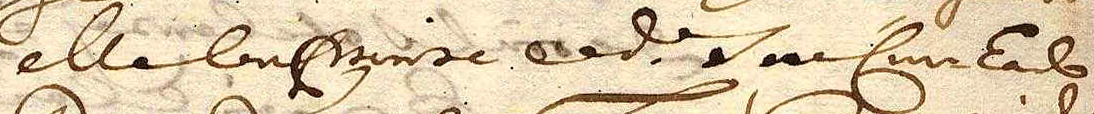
ella Confitente e o d.o seu Cunhado
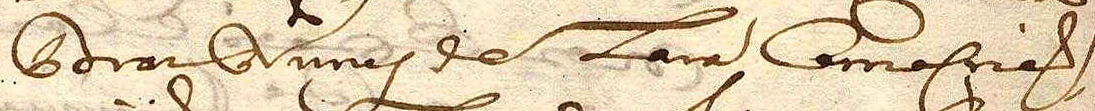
Braz Nunes de Lara Como Criaõ
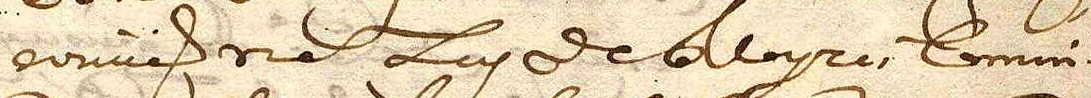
e viuiaõ na Ley de Moyzes Com in
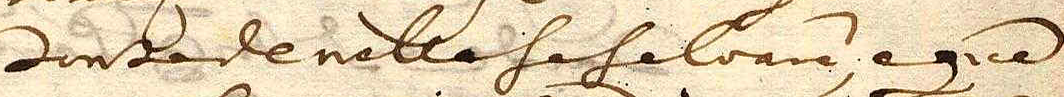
tento de nella se salvarē, e que
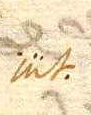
int.
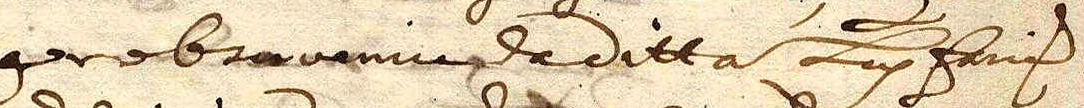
por observancia da ditta Ley faziaõ
